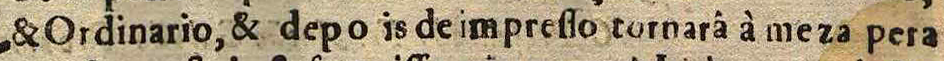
& Ordinario, & depois de impresso tornarâ à meza pera
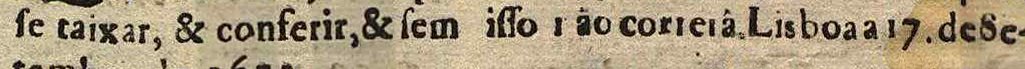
se taixar, & conferir, & sem isso não correrâ Lisboa a 17. de de
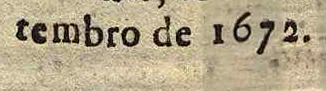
tembro de 1672.
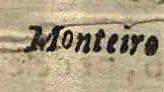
Monteiro
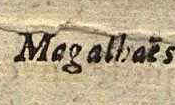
Magalhaẽs
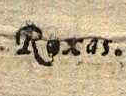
Roxas.
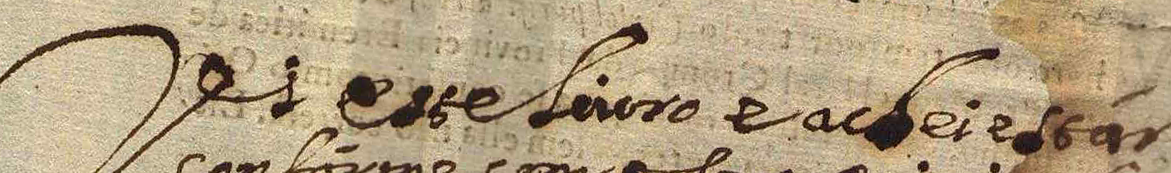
Vi este liuro e achei estar
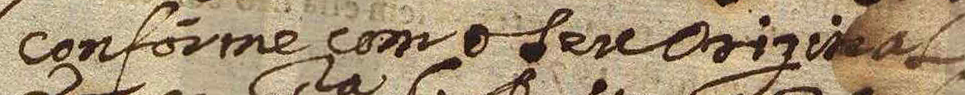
conforme com o seu original
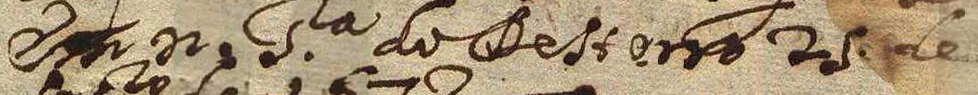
Em n. S.ra do Desterro 25. de
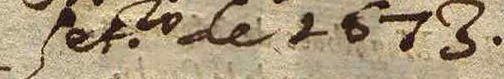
Set.ro de 1673.
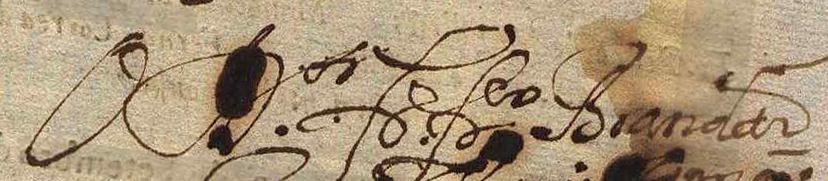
O D.or fr frco Brandaõ
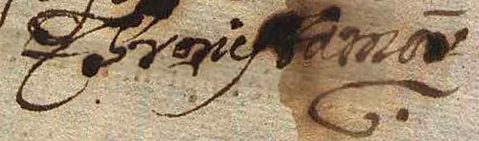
Chronista mor.
